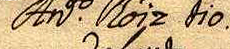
An.to Rōiz tio
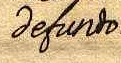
defunto.
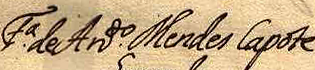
F.a de An.to Mendes Capote
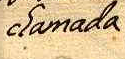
chamada
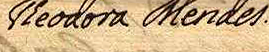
Theodora Mendes.
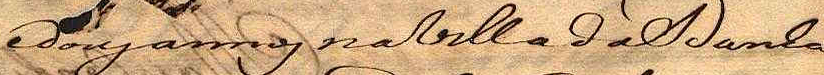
e dous annos na Villa da Idanha
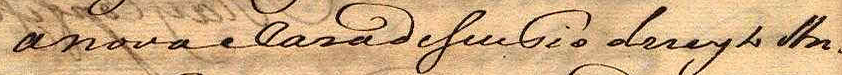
a nova e caza de seu Tio direyto An
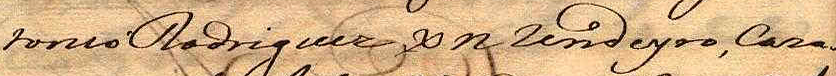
tonio Rodriguez xn Rendeyro, Caza
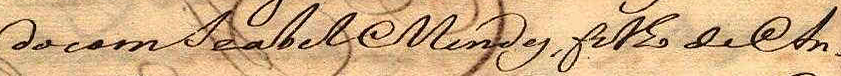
do com Izabel Mendes, filho de An
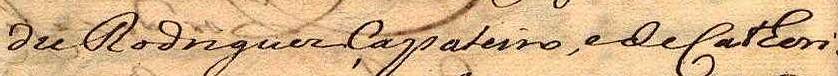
dre Rodriguez Çapateiro, e de Catheri
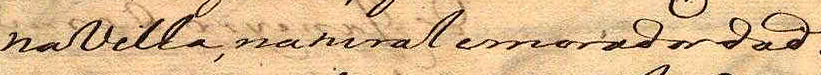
na Velha, natural e morador da d.a
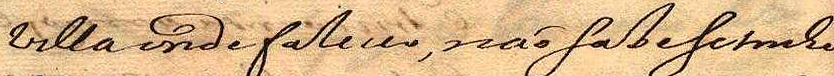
villa onde faleceo, naõ sabe se tinha
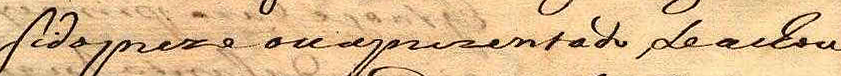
sido prezo ou aprezentado, se achou
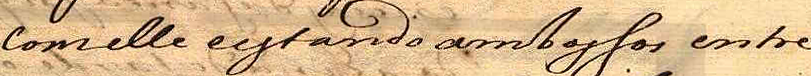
com elle e estando ambos sos entre
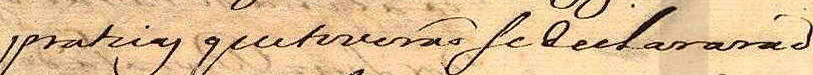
praticas que tiverão se declararaõ
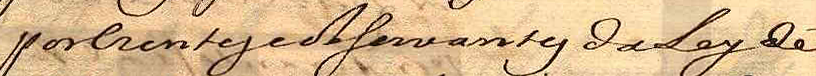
por Crentes e observantes da Ley de
